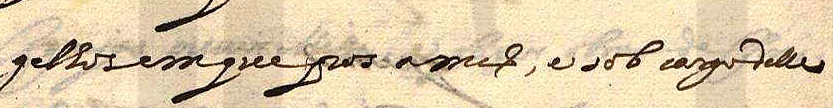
gelhos em que pos a maõ, e sob cargo delle
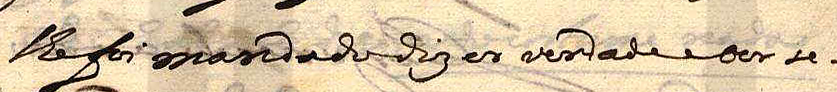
lhe foi mandado dizer verdade e ter se
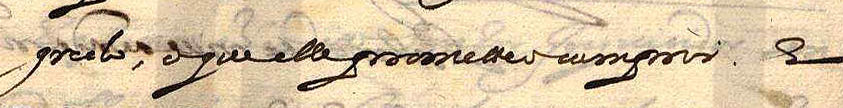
gredo, o que elle prometteo cumprir. E
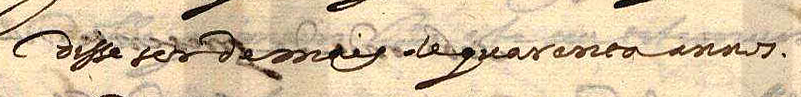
disse ser de mais de quarenta annos.
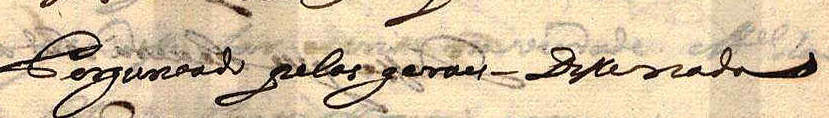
Perguntado pelas geraes - Disse nada
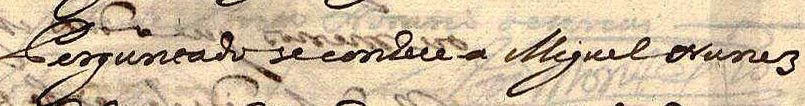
Perguntado se conhece a Miguel Nunez
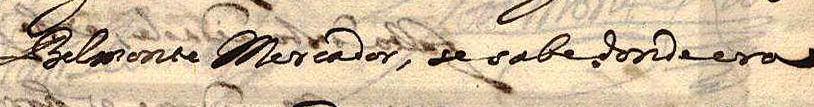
Belmonte Mercador, se sabe donde era
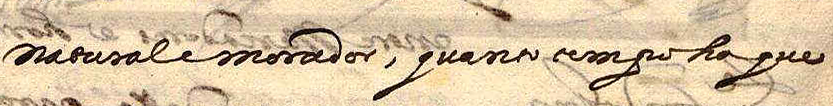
natural e morador, quanto tempo ha que
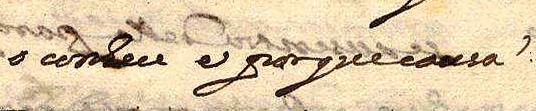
o conhece, e por que cauza?
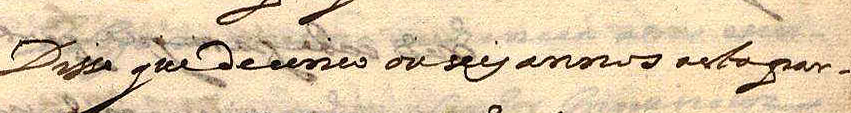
Disse que de cinco ou seis annos a esta par
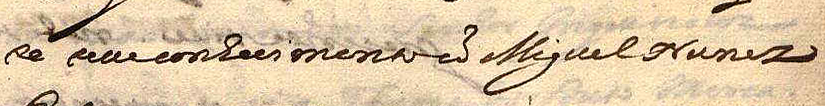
te teue conhecimento cō Miguel Nunez
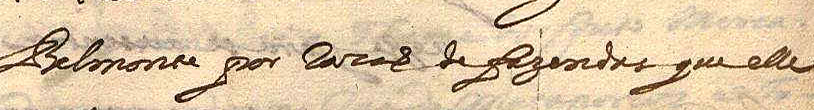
Belmonte por Razaõ de fazendas que elle
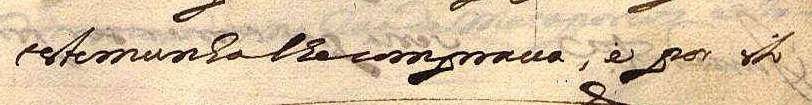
testemunha lhe compraua, e por isto
